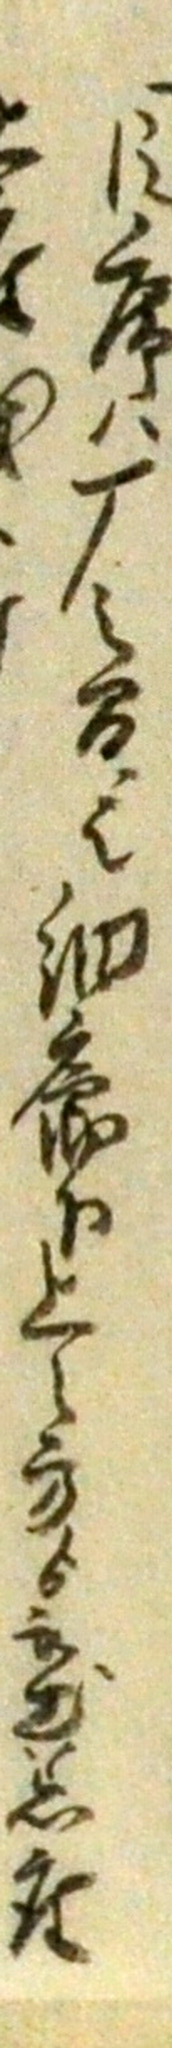同席ハ雁之間ニて細廊下上之方ゟ被出着座
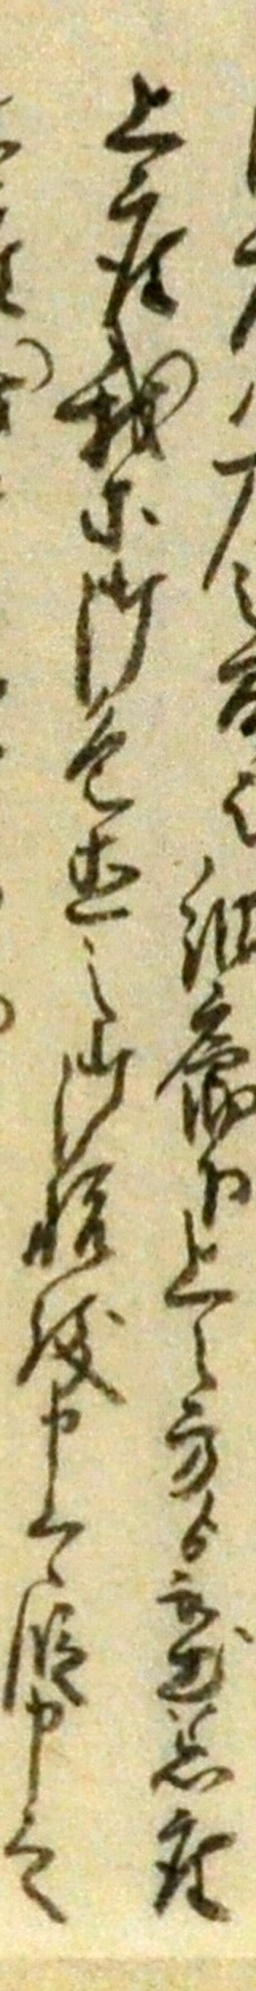上座我等御色直之御祝儀申上候段申上之
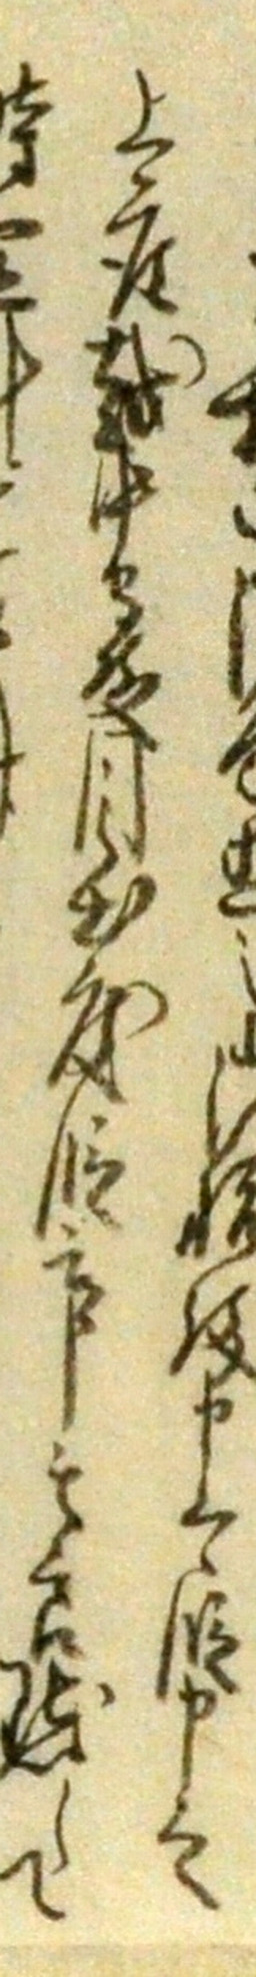上座越中守殿目出度段被申其節黙して
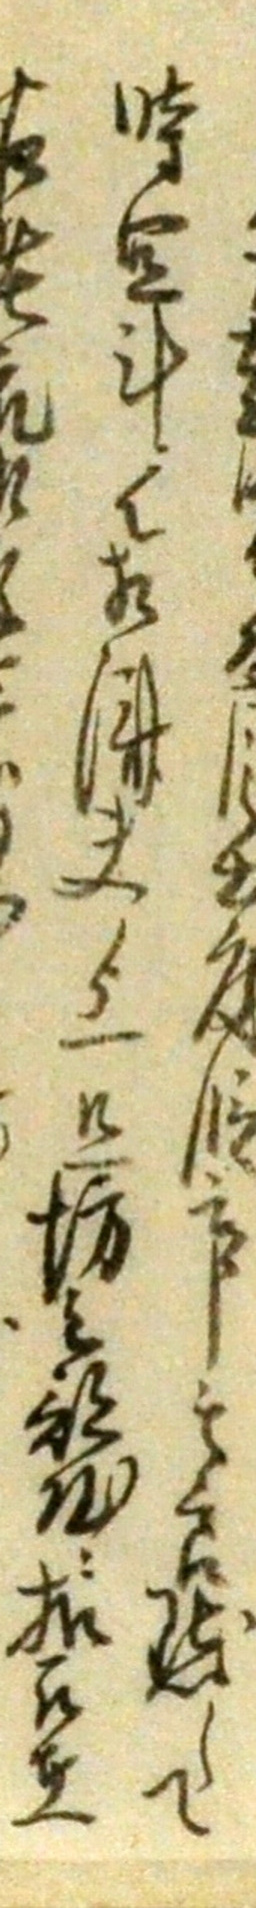時宜計ニて相済夫ゟ一旦坊主部屋ニ扣罷在
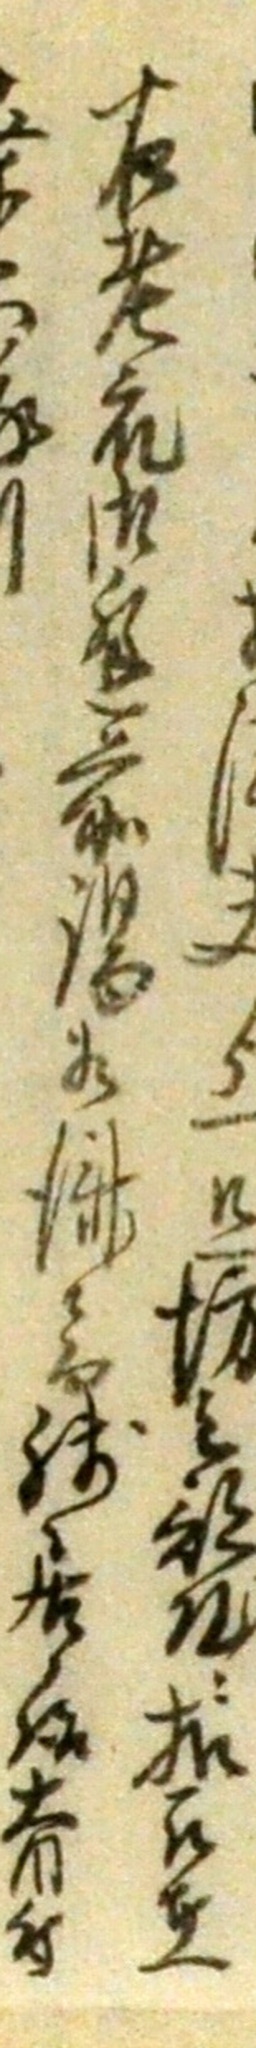右老衆御逢前謁相済ニ而残居候様大目付
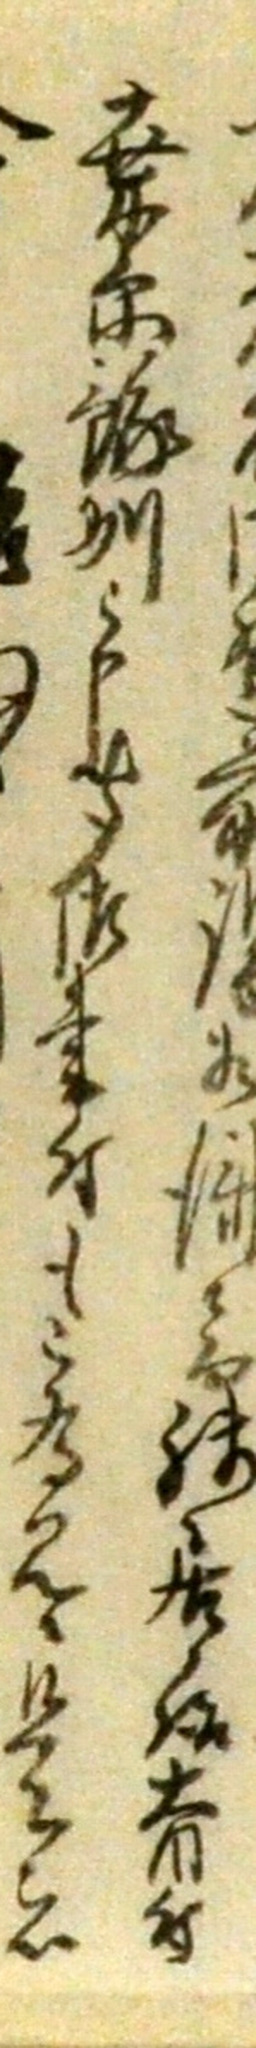桑原豫州被申聞御書付も被為見候是は
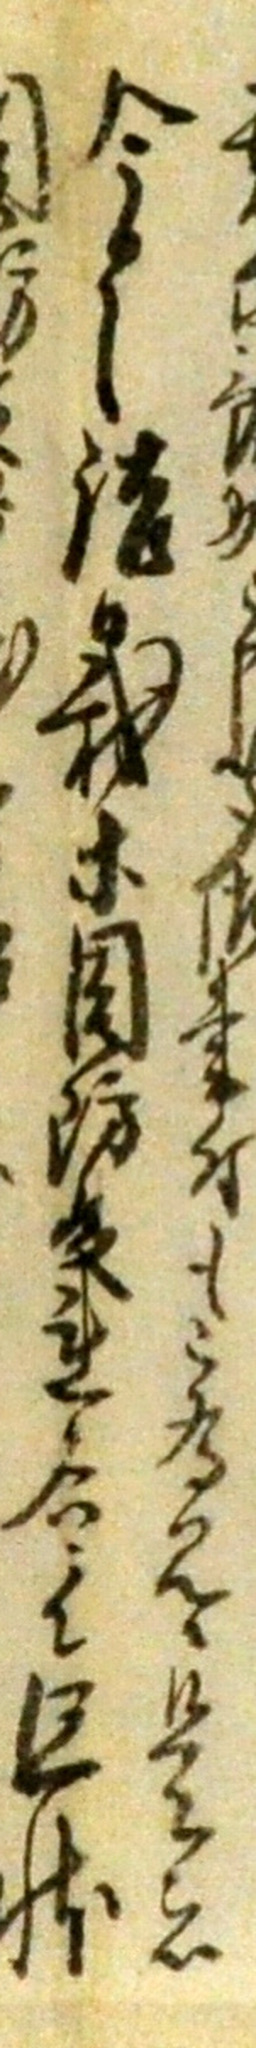今日之詰日我等周防殿連名ニて廻状
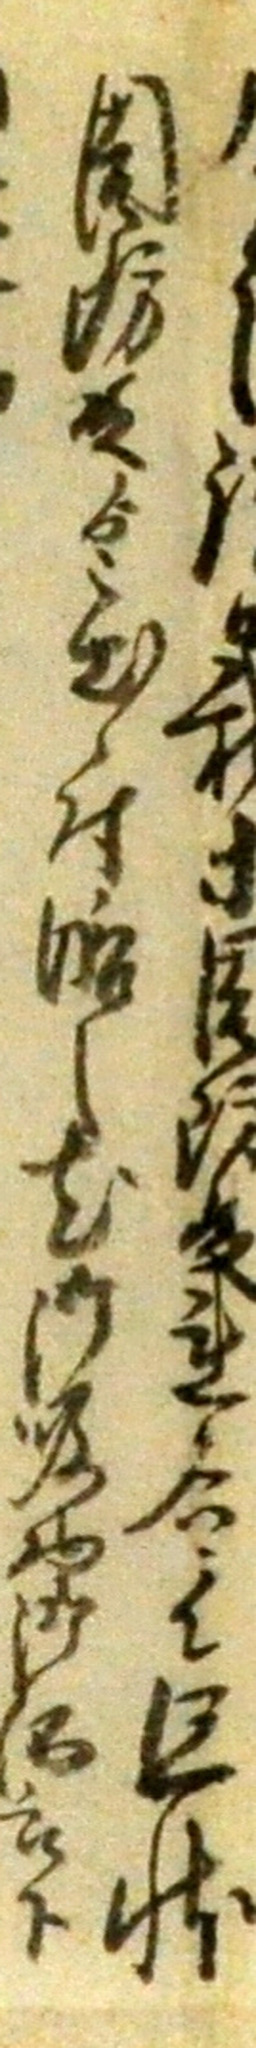周防殿ゟ被出候付略之尤御吸物御酒被下
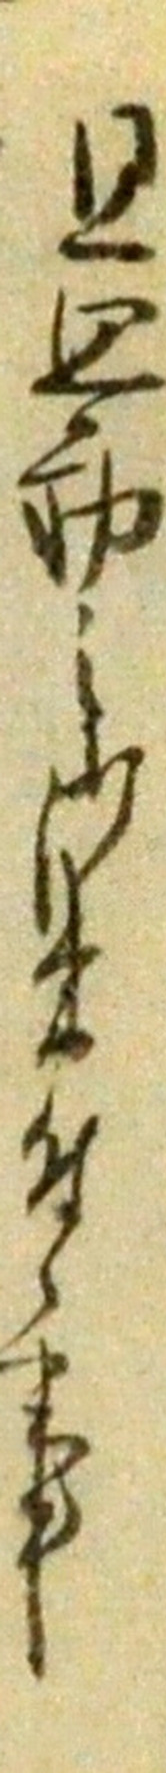且廻勤之御書付候事
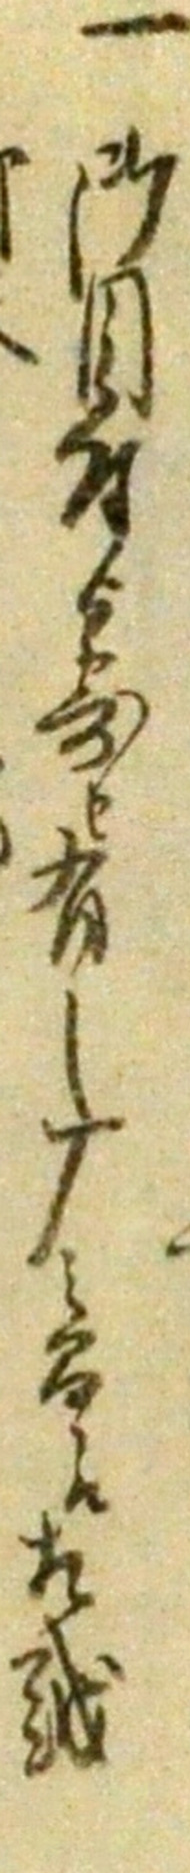一御目付ゟ寄セ有之雁之間え相越
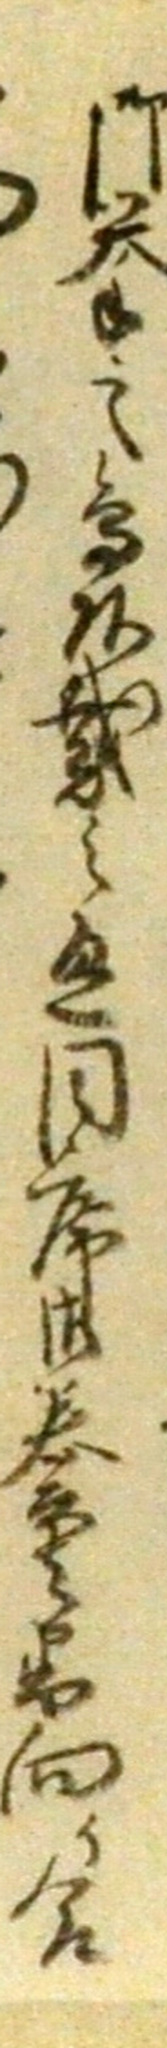御挙之鳥頂戴之通同席御奏者番向イ合
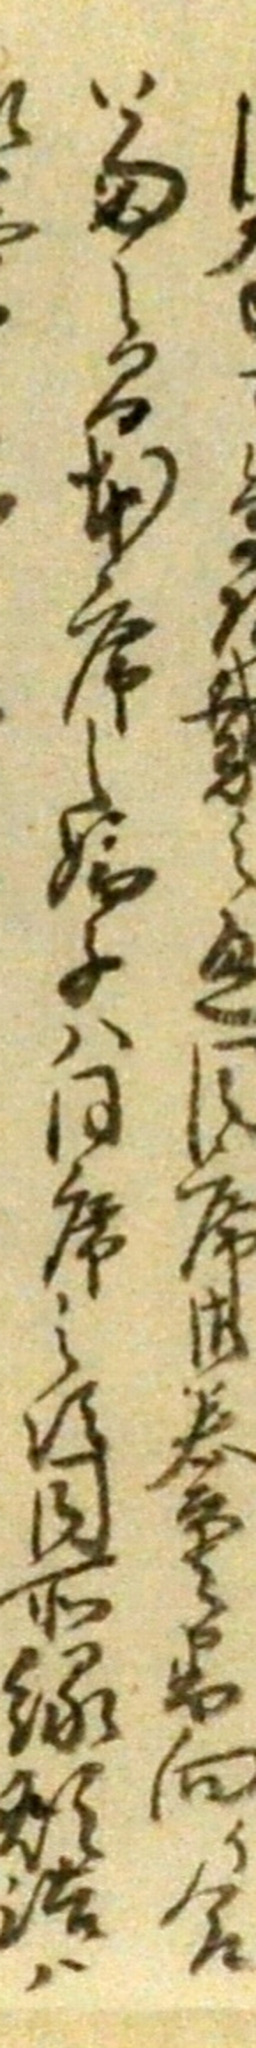菊之間本席之嫡子ハ同席之次同所縁頬詰ハ
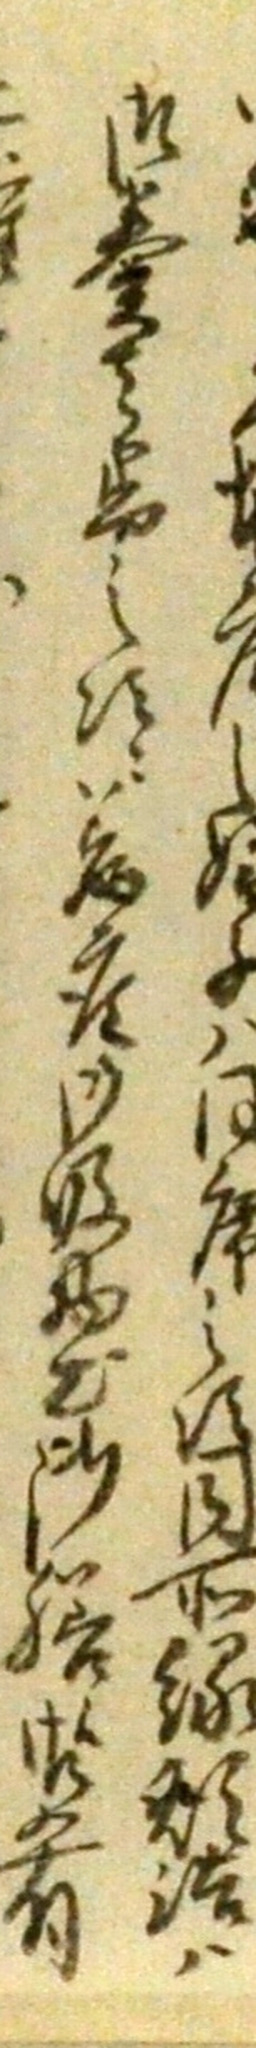御奏者番之次ニ着座御吸物出御膳え御肴
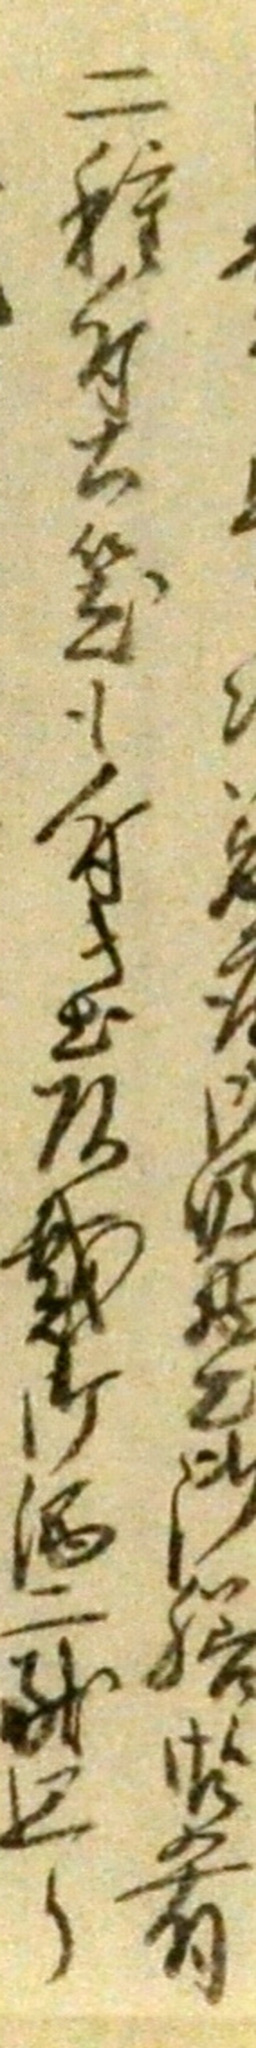二種付土器も付キ出頂戴御酒二献廻り
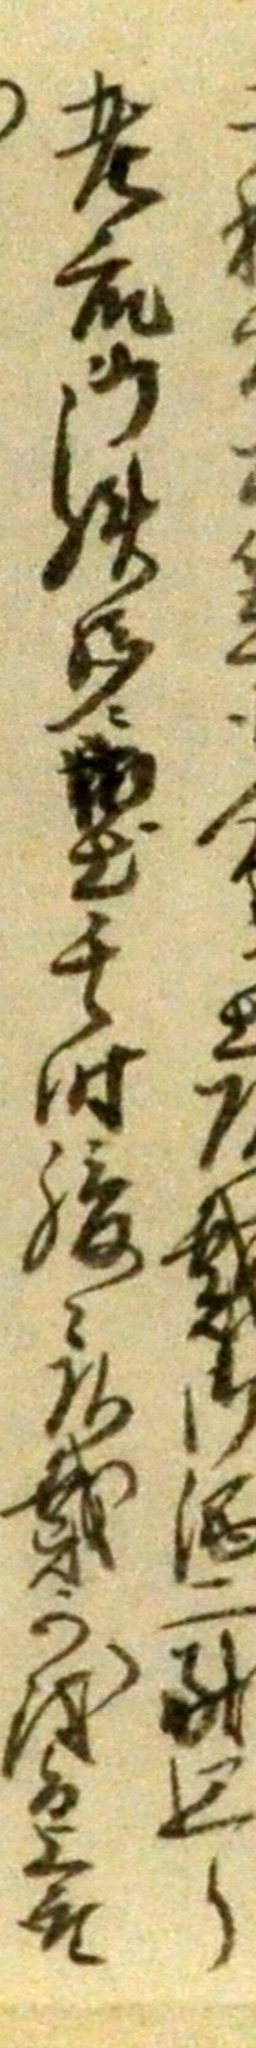老衆御挨拶ニ被出其時緩々頂戴可致旨上座
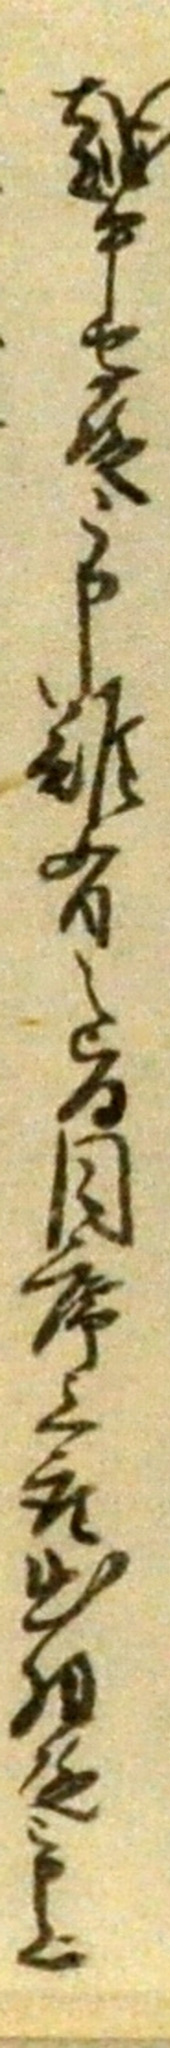越中守殿被申難有之旨同席上座出羽殿被申上
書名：若君様御色直御祝儀ノ節ノ留
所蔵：伊那市立高遠町図書館・合同会社AMANE
